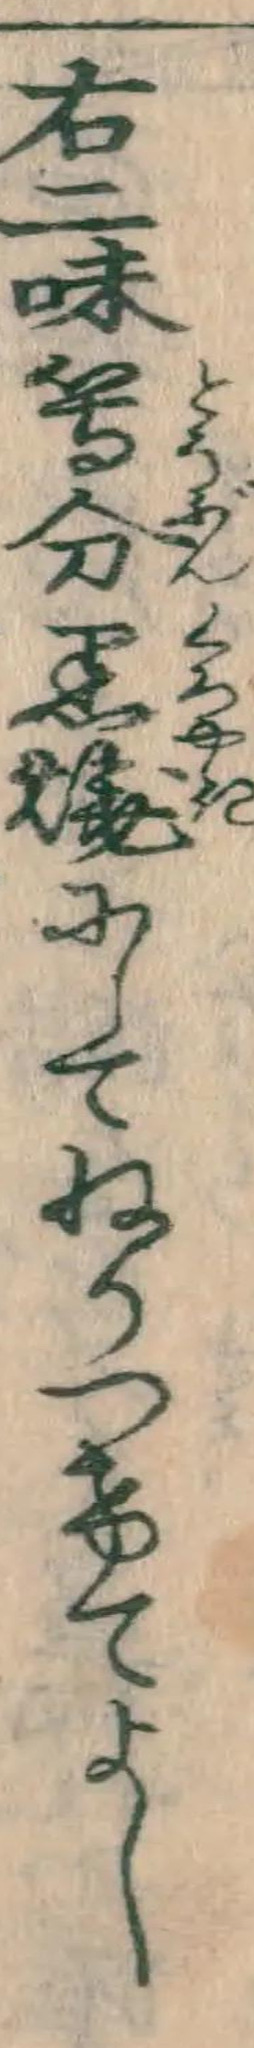右二味等分黒焼にしてねりつけてよし
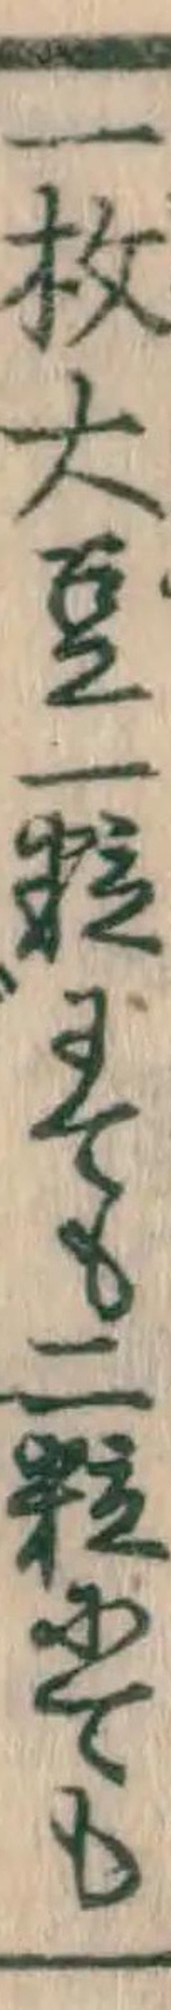一枚大豆一粒にても二粒にても
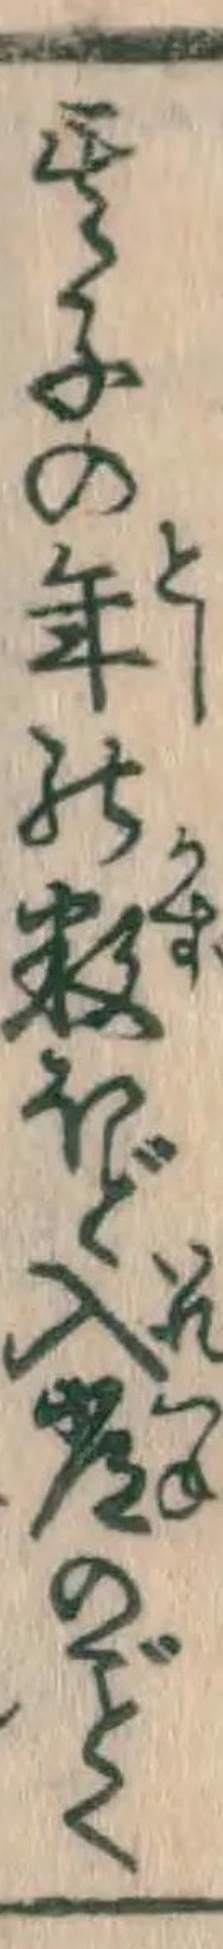其子の年の数ほど入常のごとく
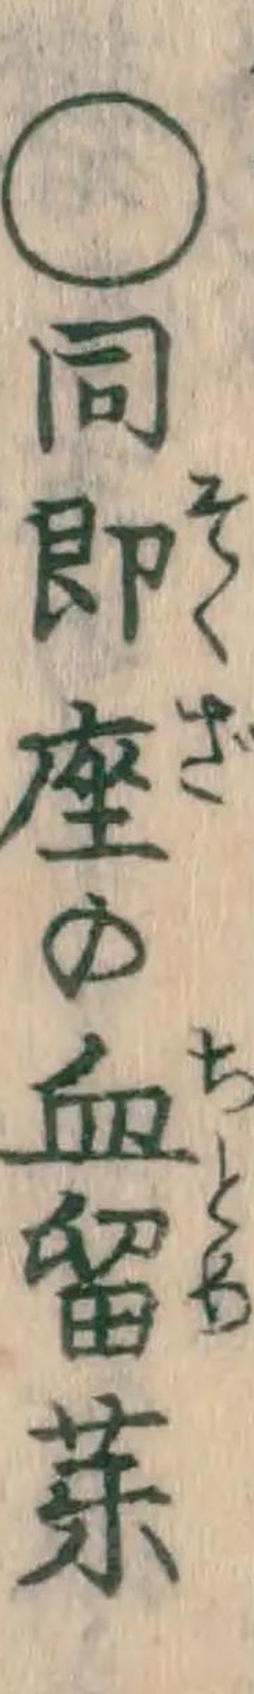○同即座の血留薬
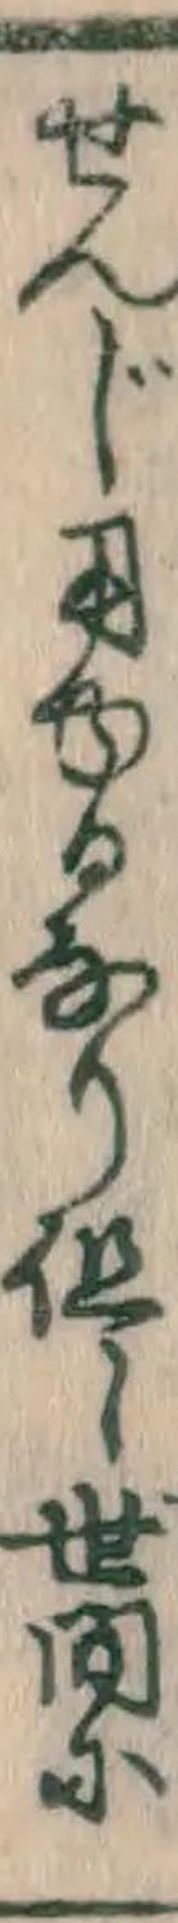せんじ用ゆるなり但し世間に
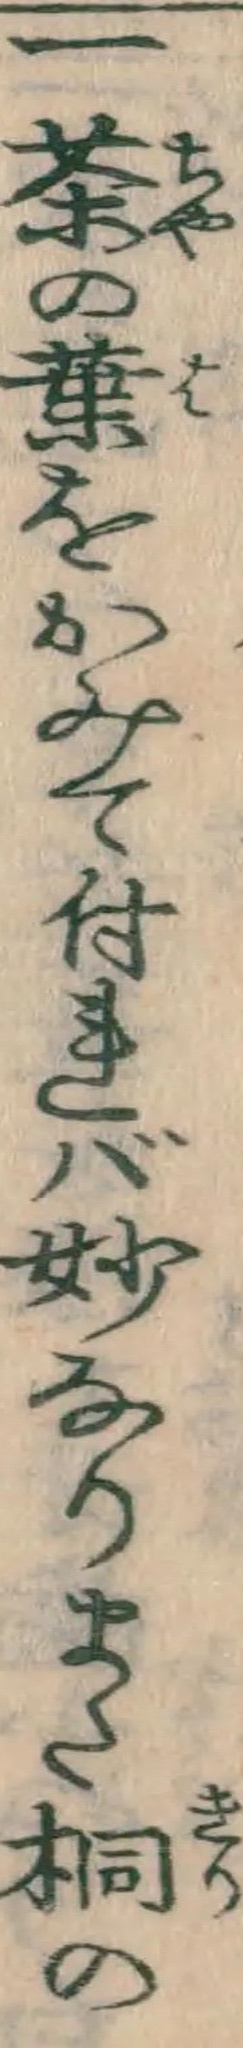一茶の葉をかみて付れば妙なりまた桐の
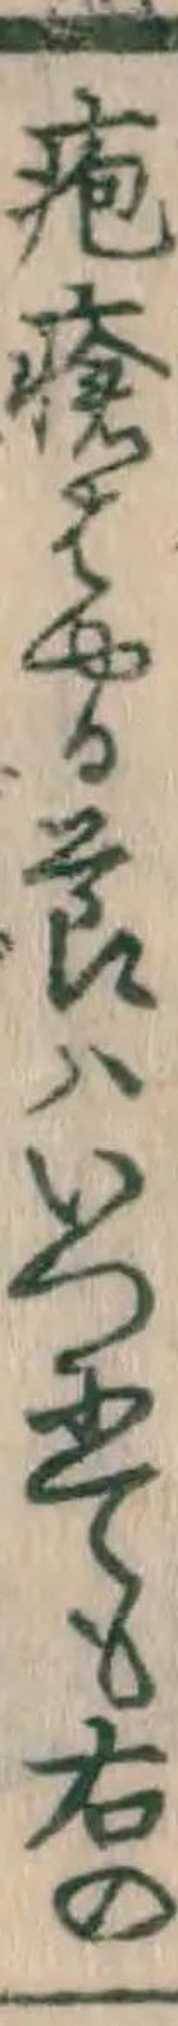疱瘡はゆる節はいつにても右の
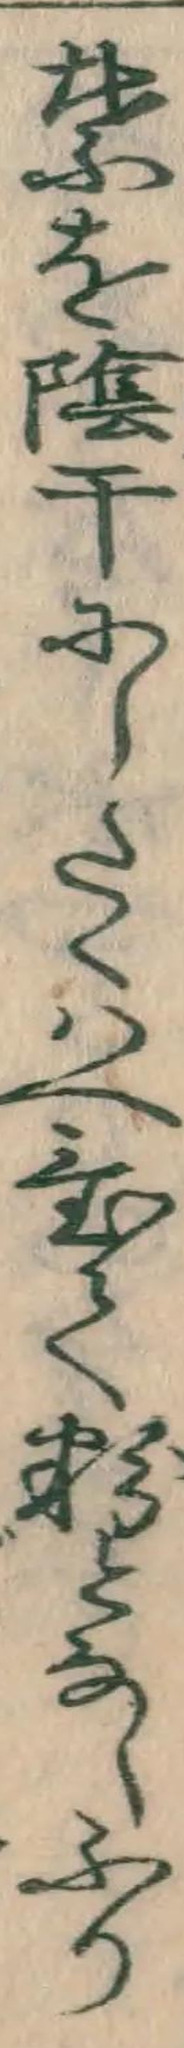葉を陰干にしたくはへ置て粉となしふり
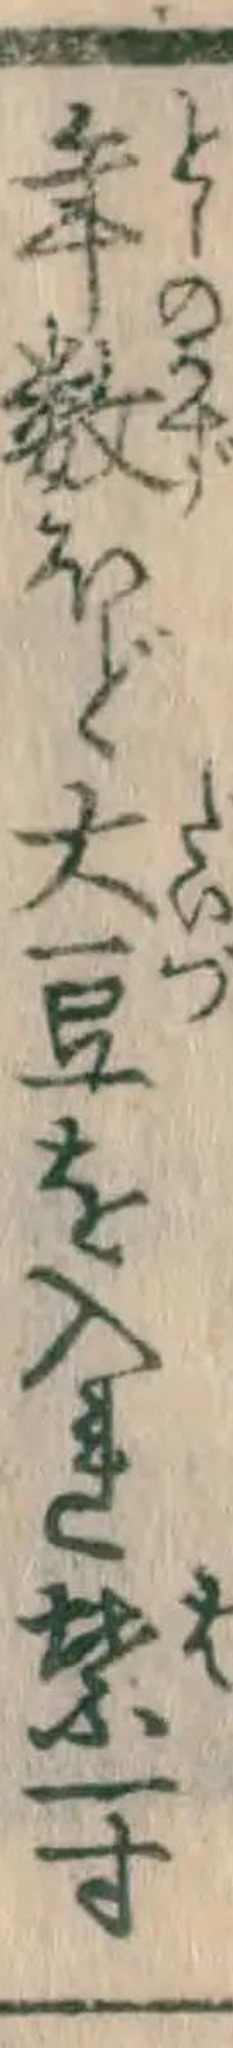年数ほど大豆を入れ葉一寸
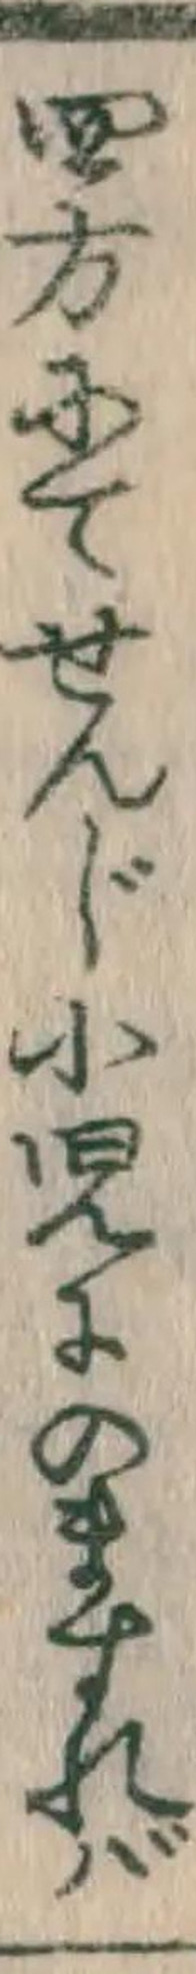四方にてせんじ小児にのますれば
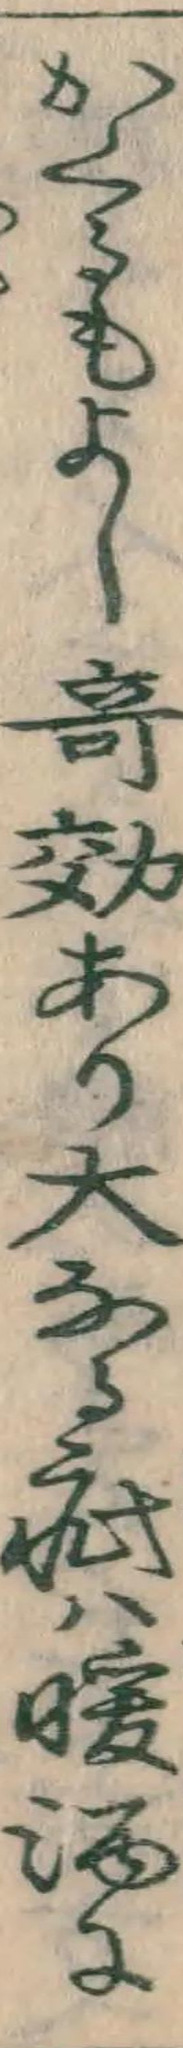かくるもよし奇効あり大なる疵は暖酒に
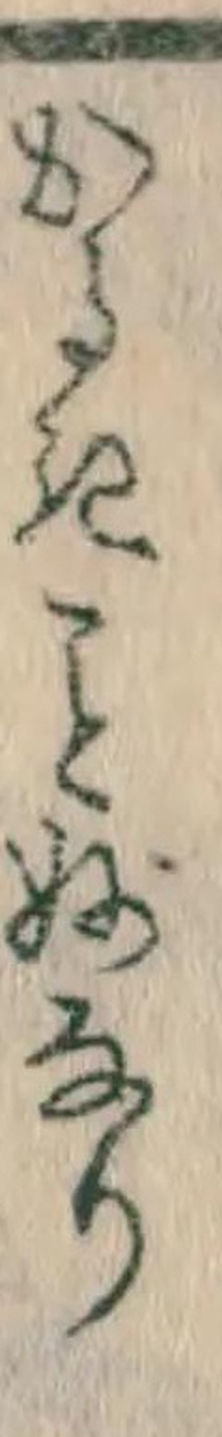かるきこと妙なり
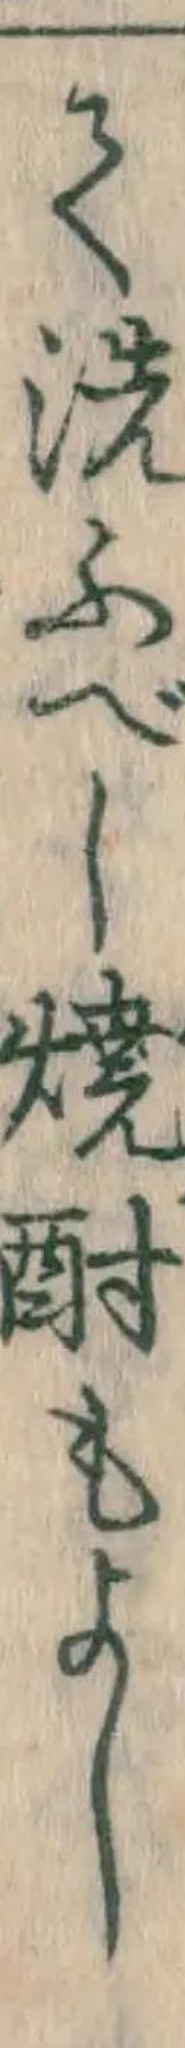て洗ふべし焼酎もよし
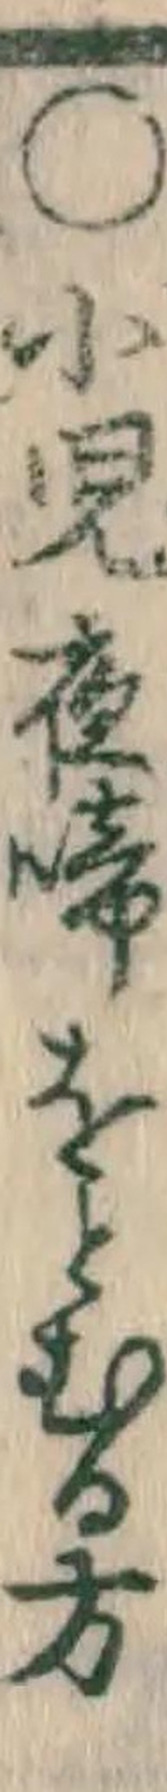○小児夜啼をとむる方
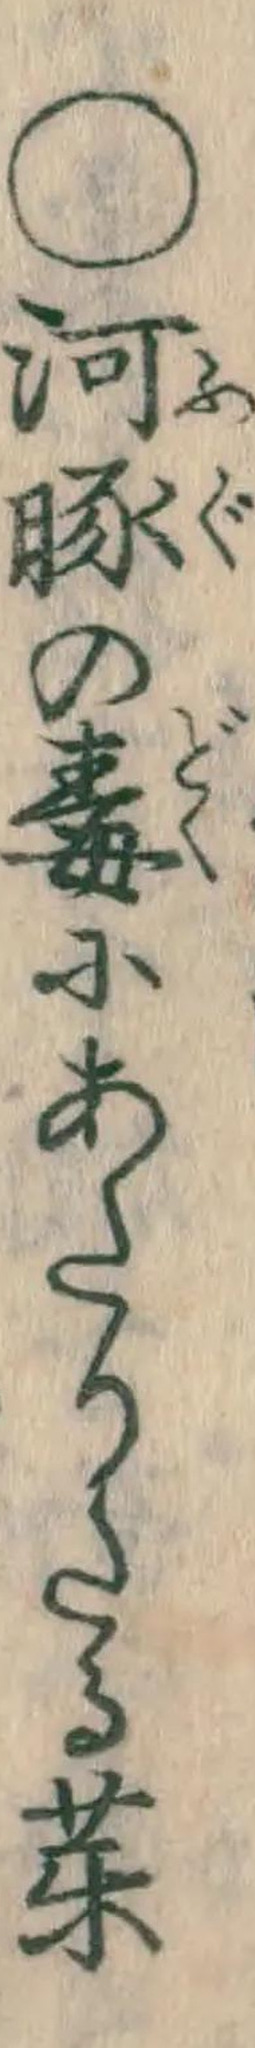○河豚の毒にあたりたる薬
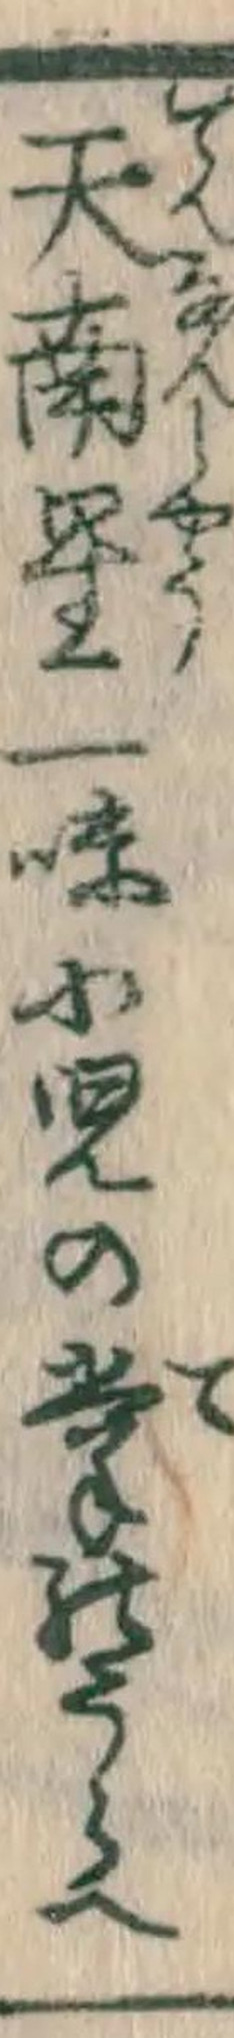天南星一味小児の掌のうらへ
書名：広益秘事大全 3巻. [4]
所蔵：国立国会図書館 National Diet Library, JAPAN
